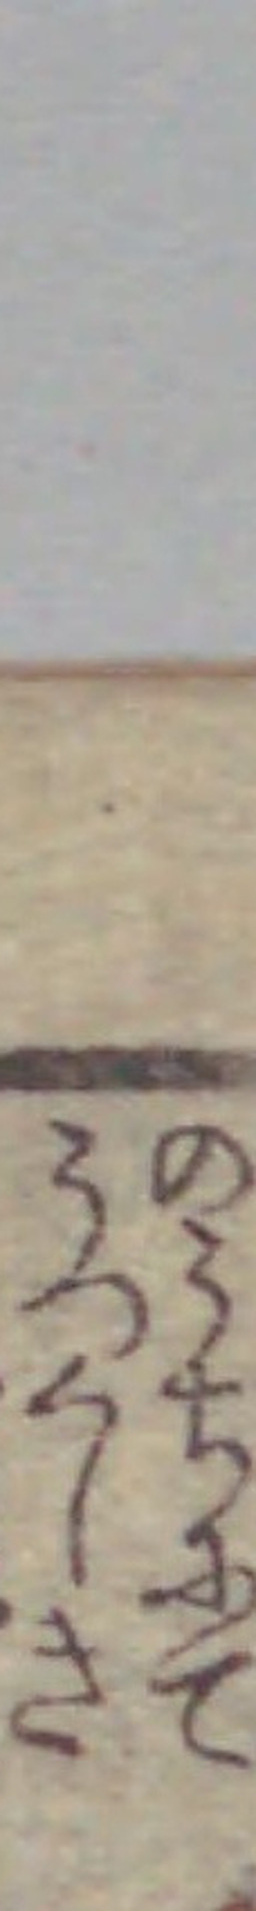うつくしき
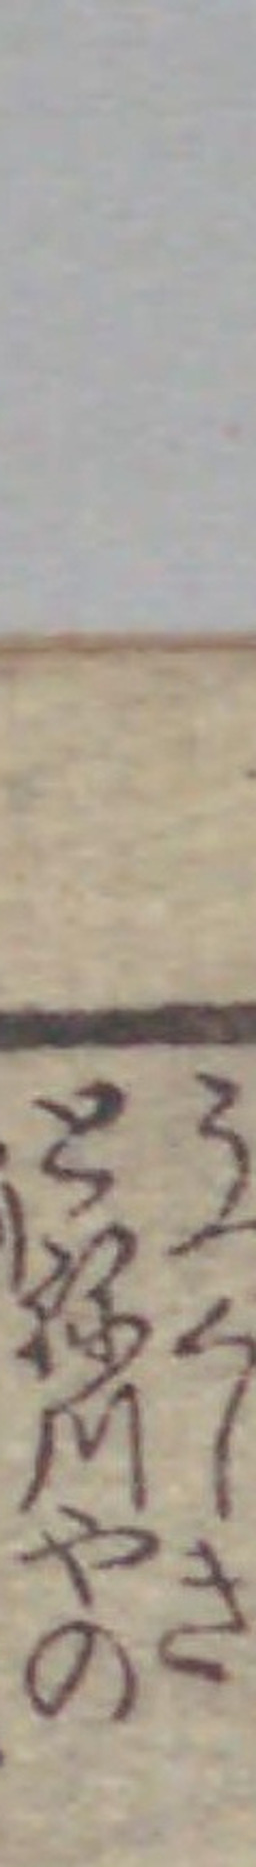とね川やの
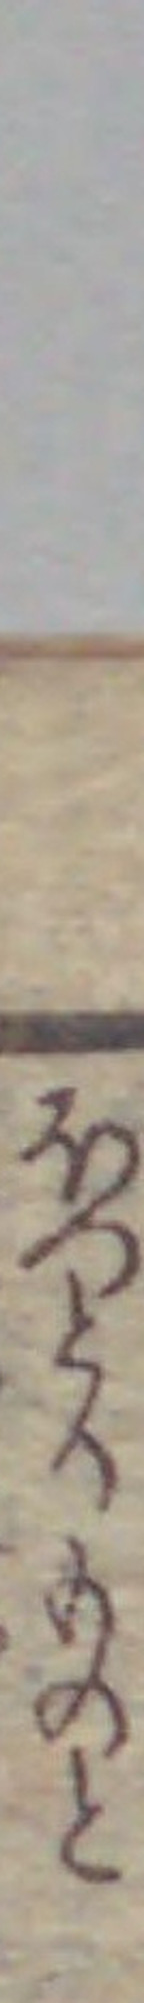ほつとりものと
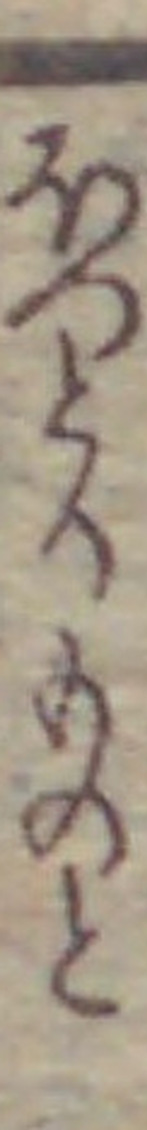ほつとりものと
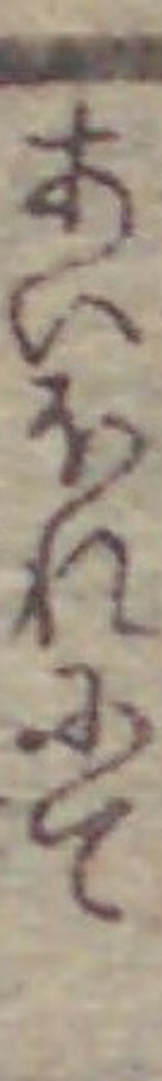あいほれにて
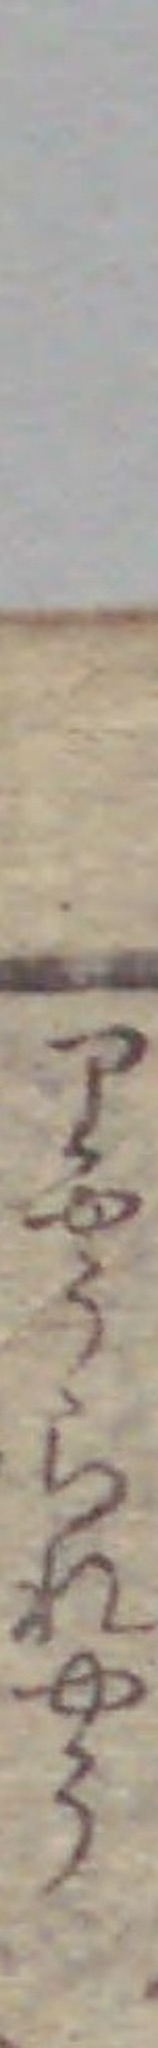りやうられやう
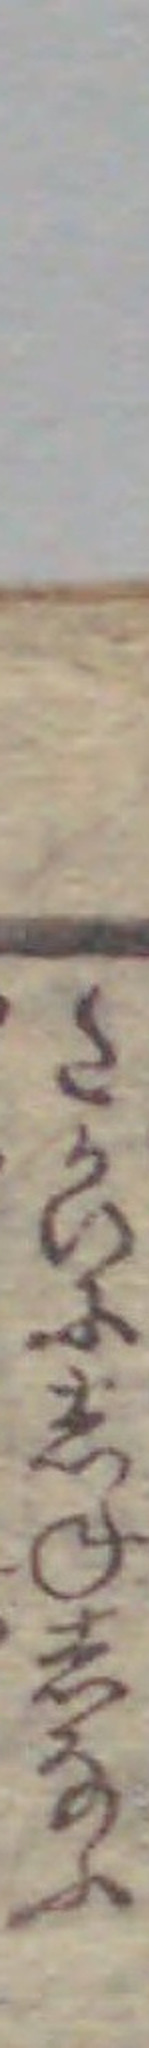たかいにしねしなふ
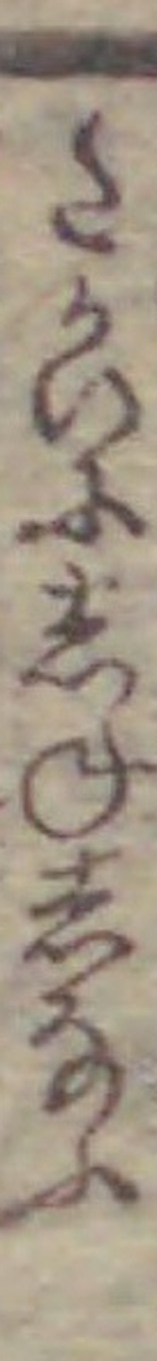たかいにしねしなふ
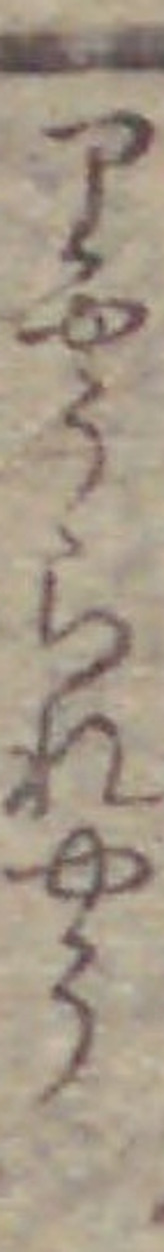りやうられやう
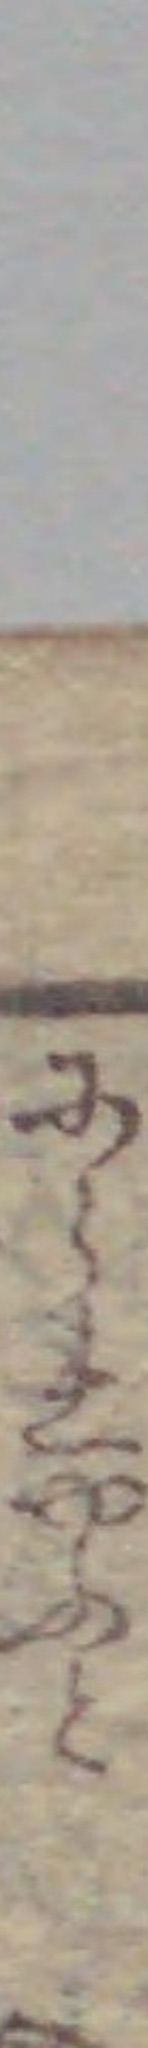にられやふと
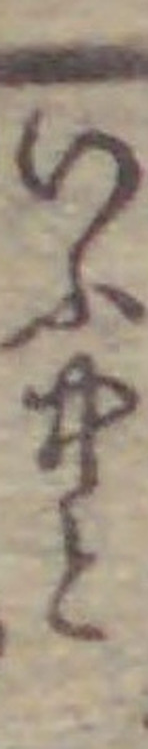いふ中と
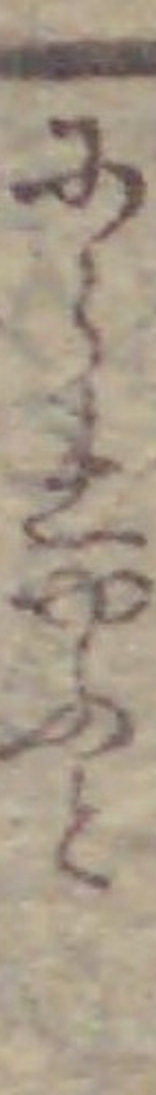にられやふと

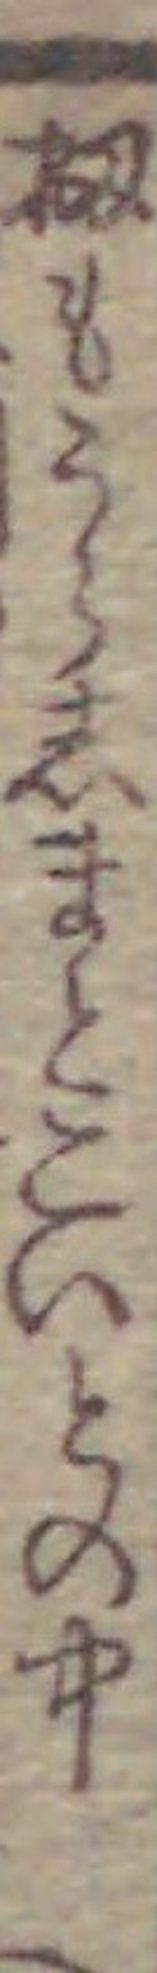扨もうらしまとこいとの中
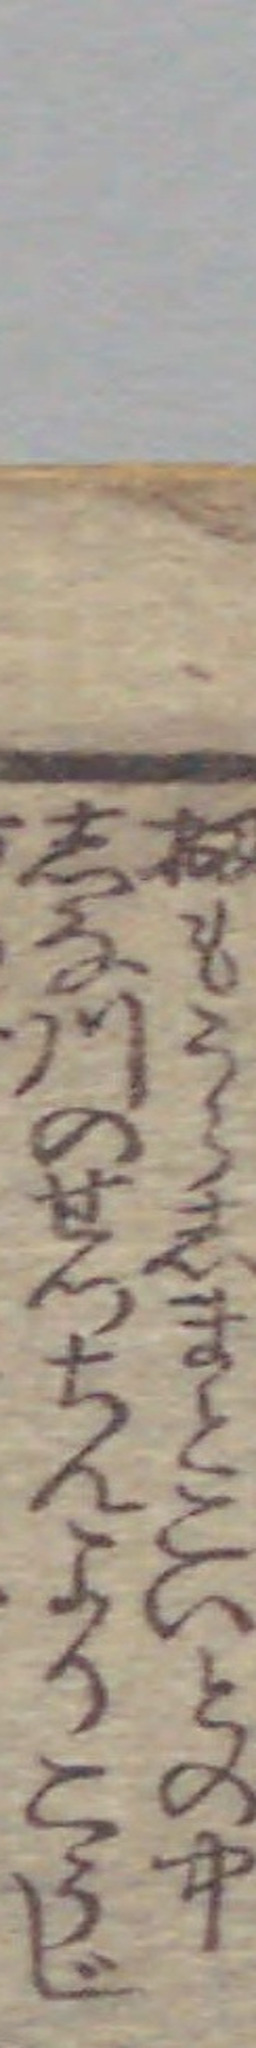しな川のせつちんよりこうじ
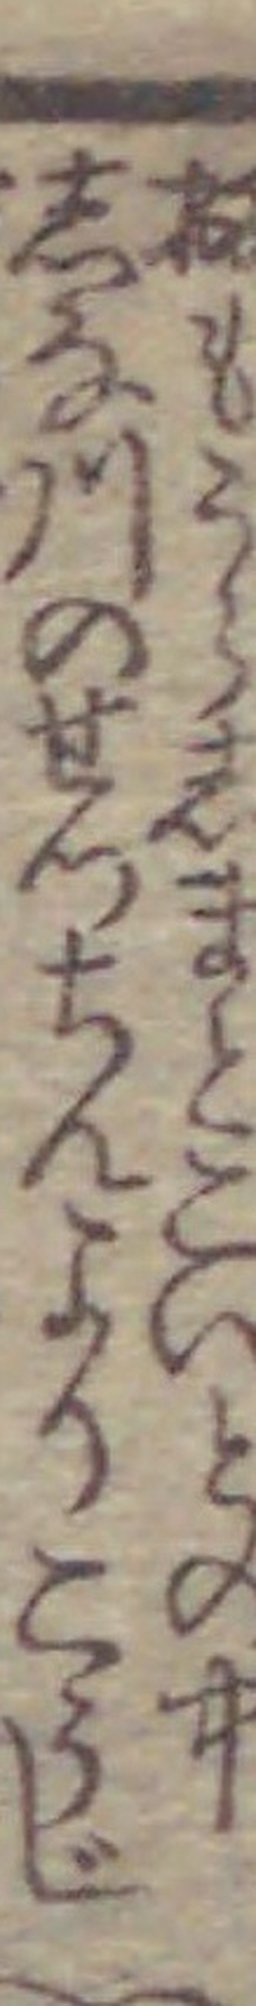しな川のせつちんよりこうじ
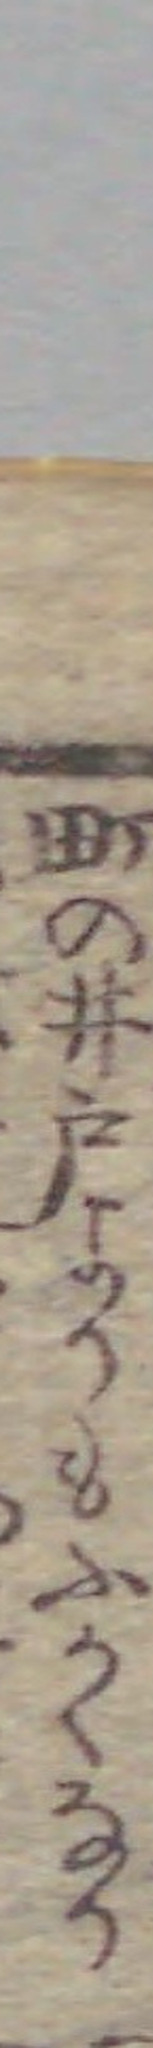町の井戸よりもふかくなり
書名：箱入娘面屋人魚 3巻
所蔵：国立国会図書館 National Diet Library, JAPAN
